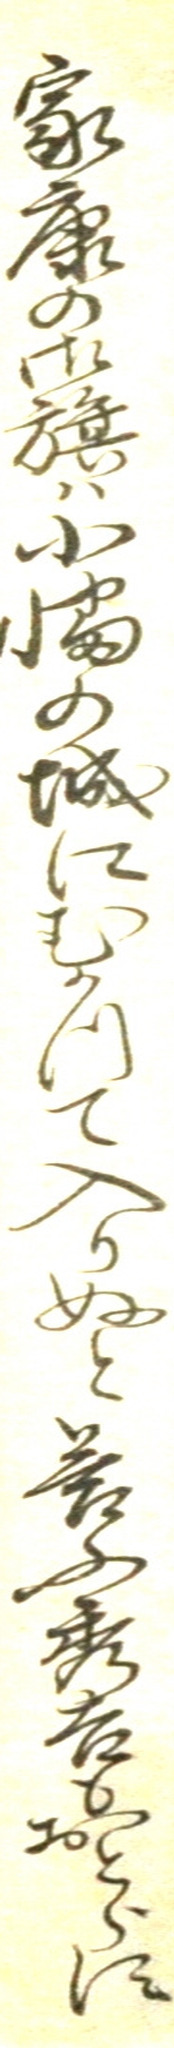家康の御旗は小幡の城にむかつて入りぬと答ふ秀吉もおとらす
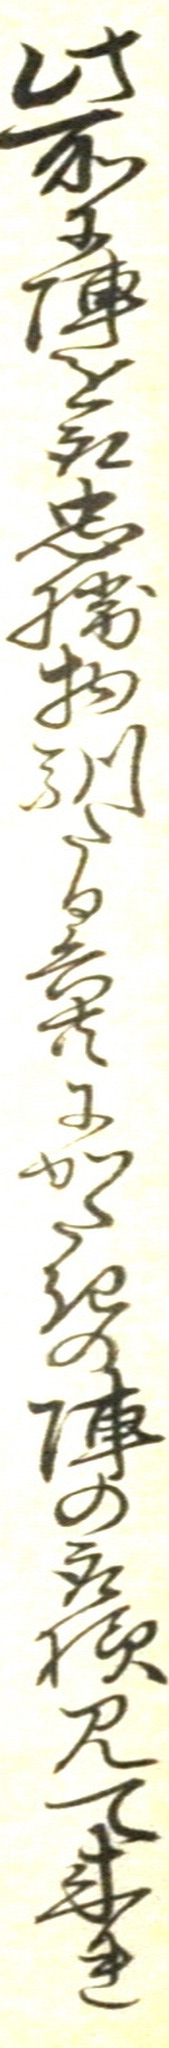此所に陣を取忠勝物馴たる兵共にかたきの陣の取様見て来れ
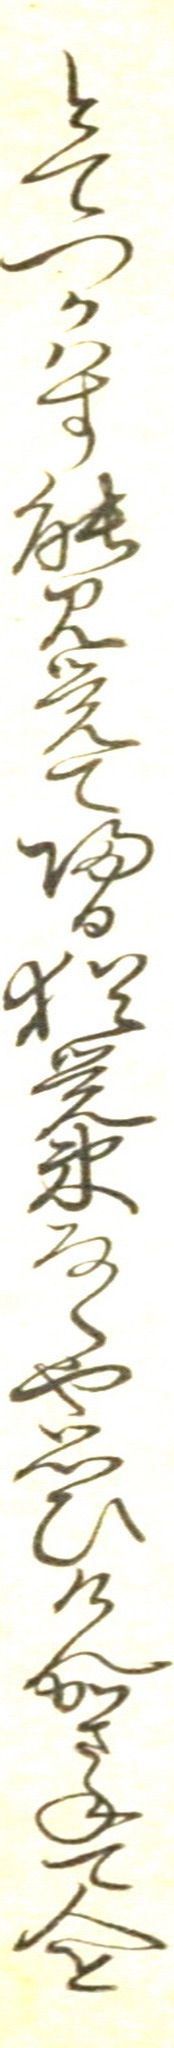とてつかはす能見覚て帰る猶覚束なくや思ひけんかさねて人を
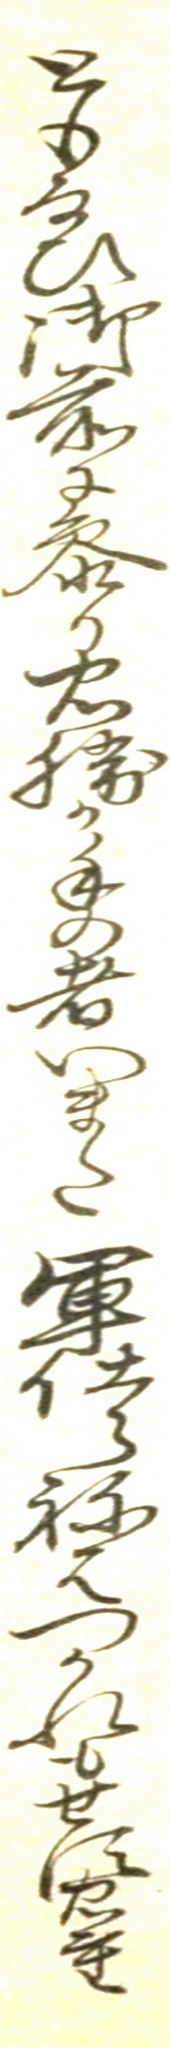ともなひ御前に参り忠勝か手の者いまた軍仕らねはつかれもせす忠重
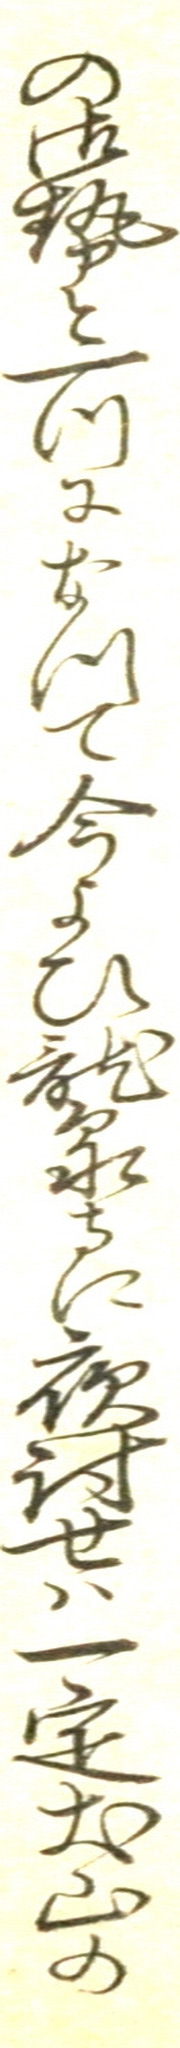の御勢と一つになつて今よひ龍泉寺に夜討せは一定犬山の
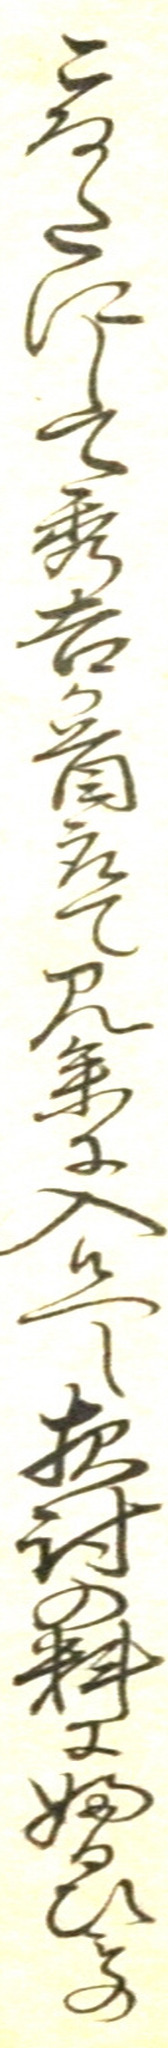こなたにして秀吉か首取て見参に入候へし夜討の料にふるひもの
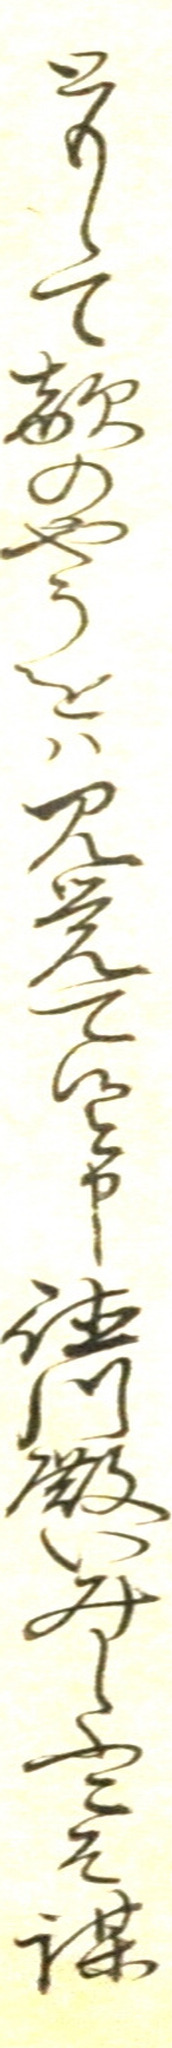ともして敵のやうをは見覚て候と申す徳川殿いみしふこそ謀
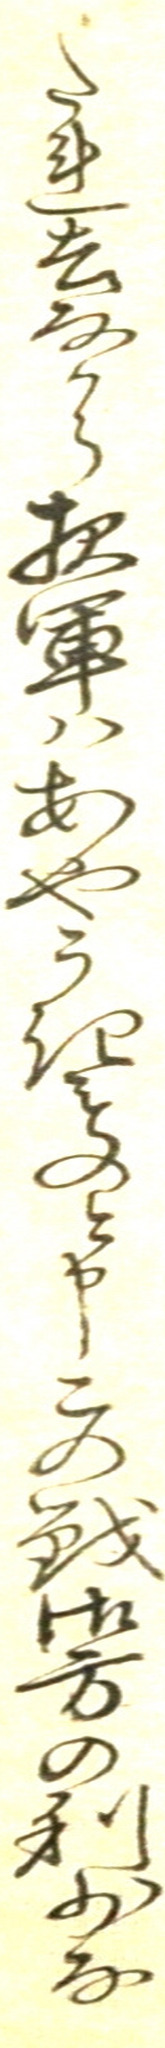たれ去なから夜軍はあやうきものと申この戦御方の利少な
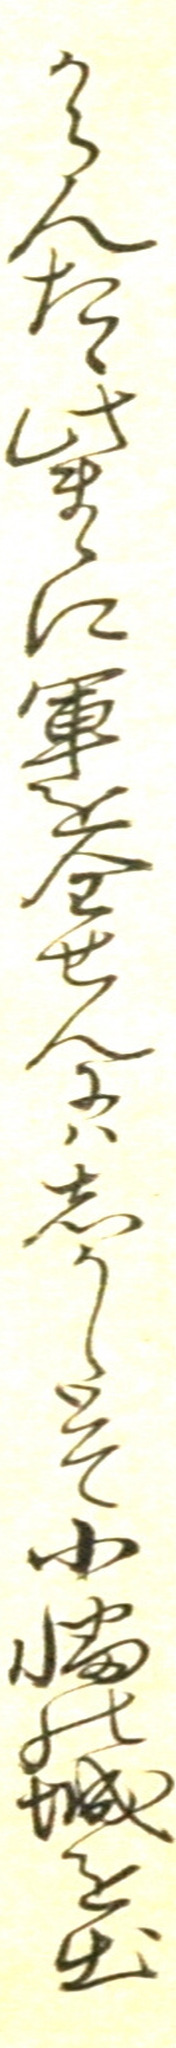からんたゝ此まゝに軍を全せんにはしかしとて小幡の城を出

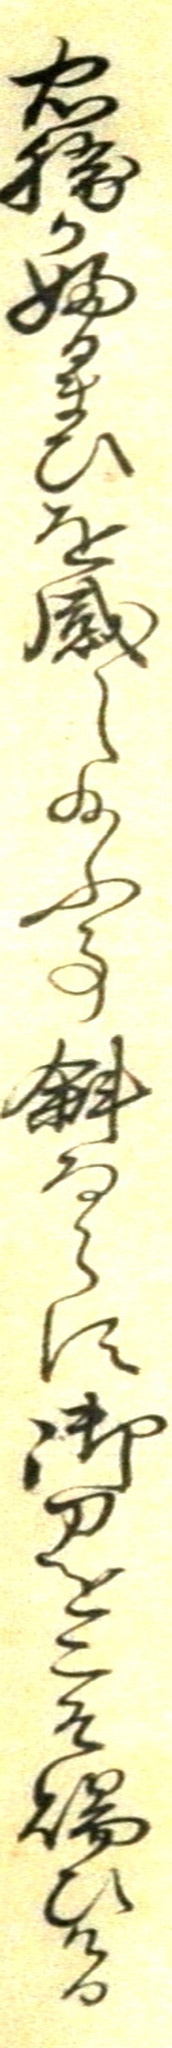忠勝かふるまひを感し給ふ事斜ならす御刀をこそ賜ひける
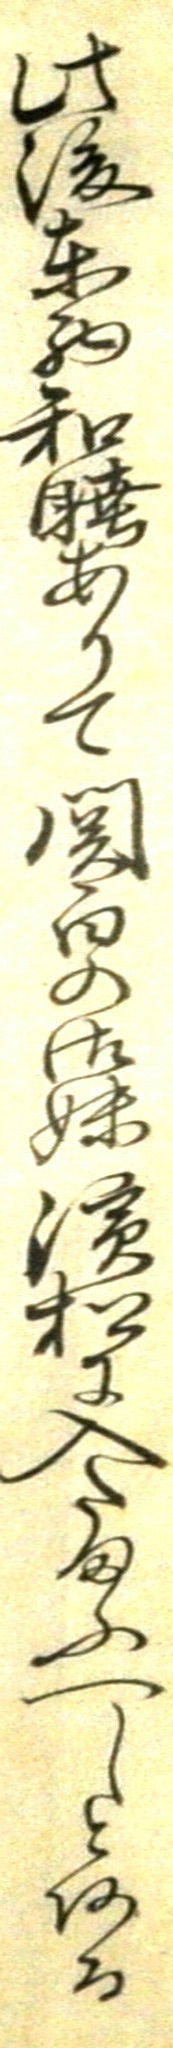此後東西和睦ありて関白の御妹浜松に入たまふへしとある
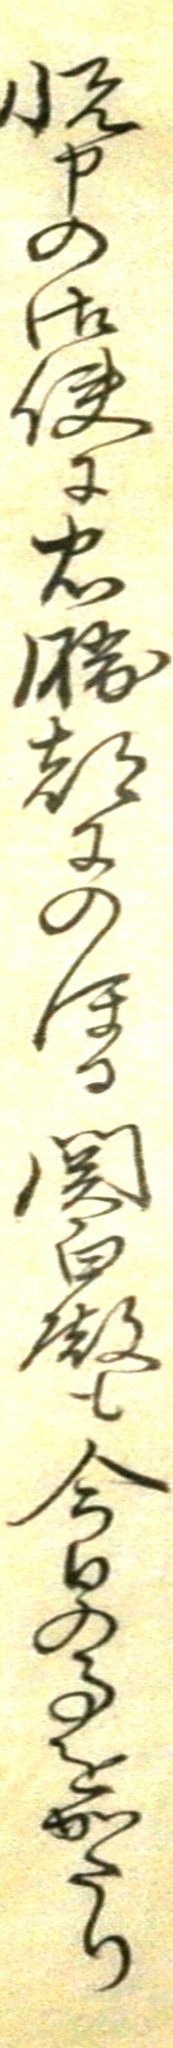悦申の御使に忠勝都にのほる関白殿も今日の事をかたり
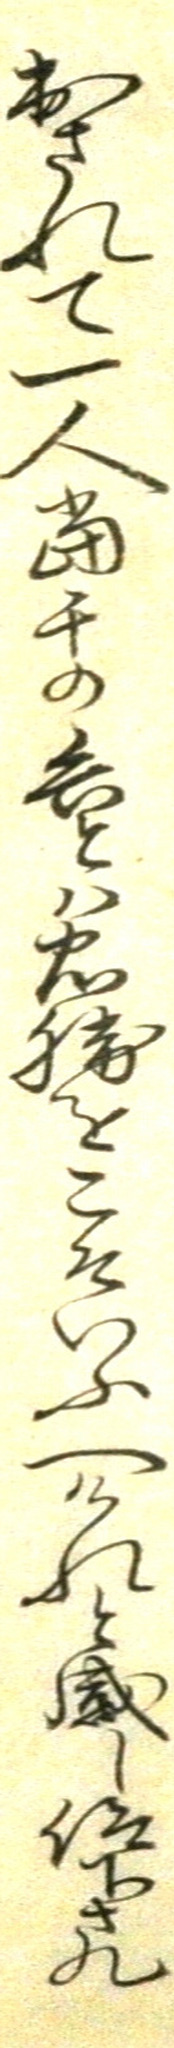出されて一人当千の兵とは忠勝をこそいふへけれと感し仰下され
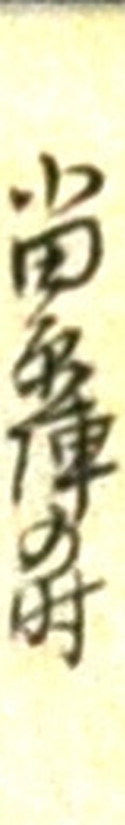小田原陣の時
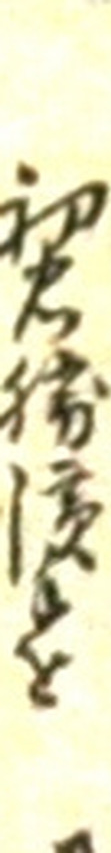初忠勝浜手を
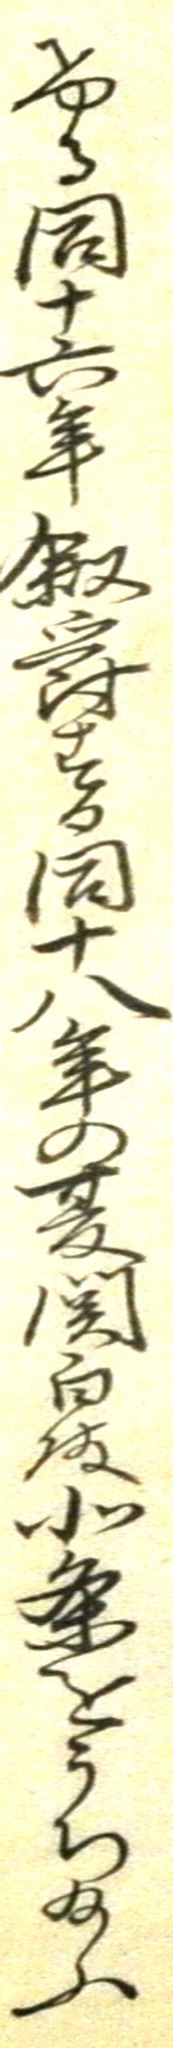ける同十六年叙爵する同十八年の夏関白殿北条をうち給ふ
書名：藩翰譜（四・上）
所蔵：伊那市立高遠町図書館・合同会社AMANE
